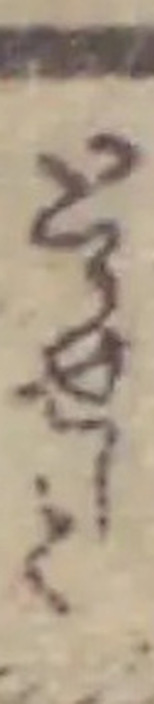とらせしと
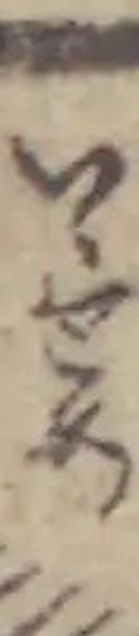いゝせめ
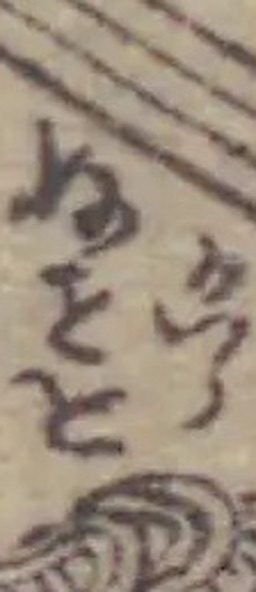ぬことを
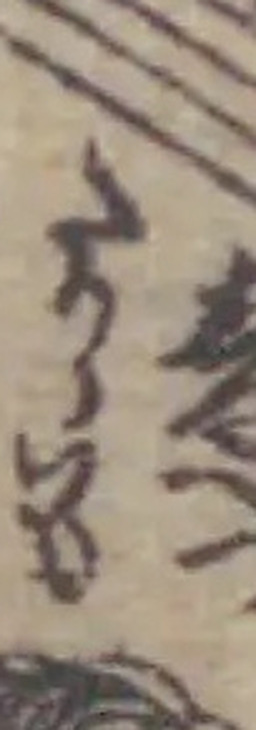たからいも
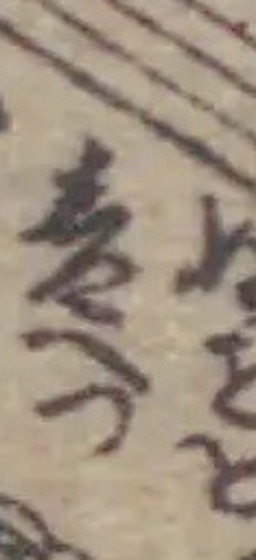しやへつ
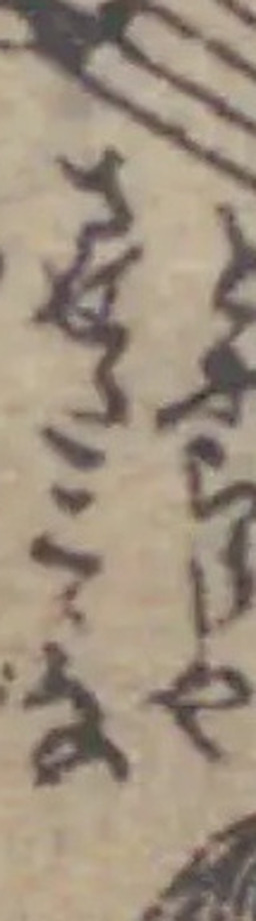させたこゝな
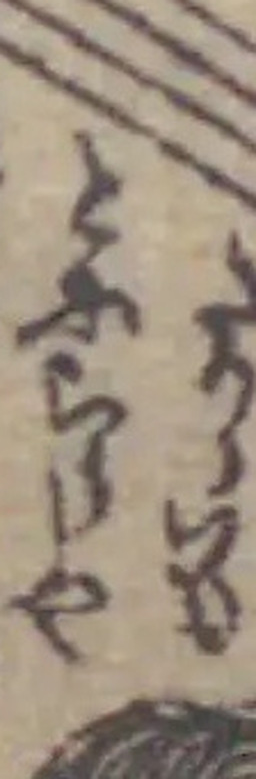とにらうしや
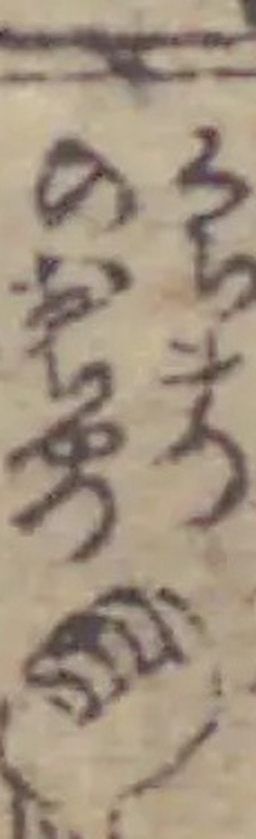のおちやつ
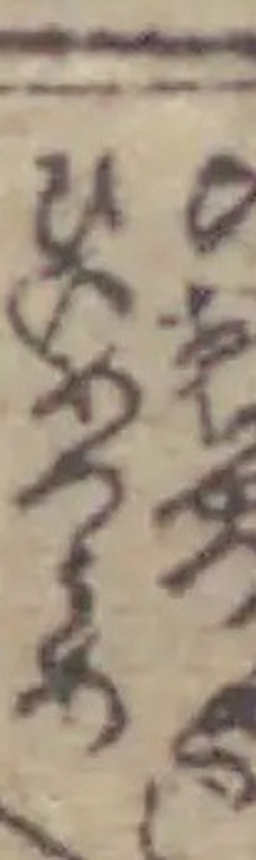ひいめつらめ
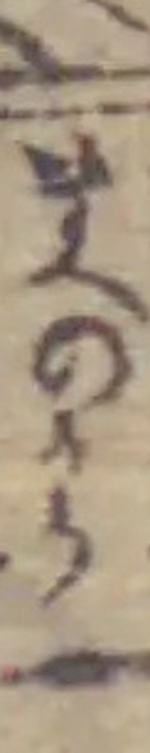まへのかう
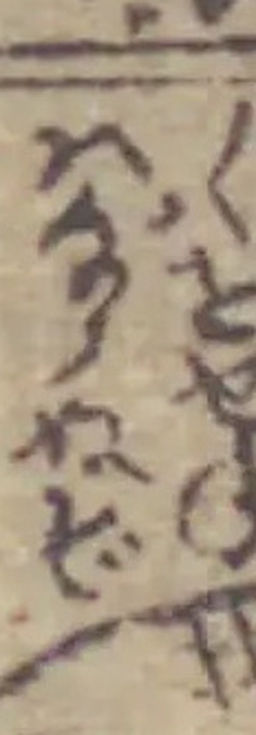はならぬぞ
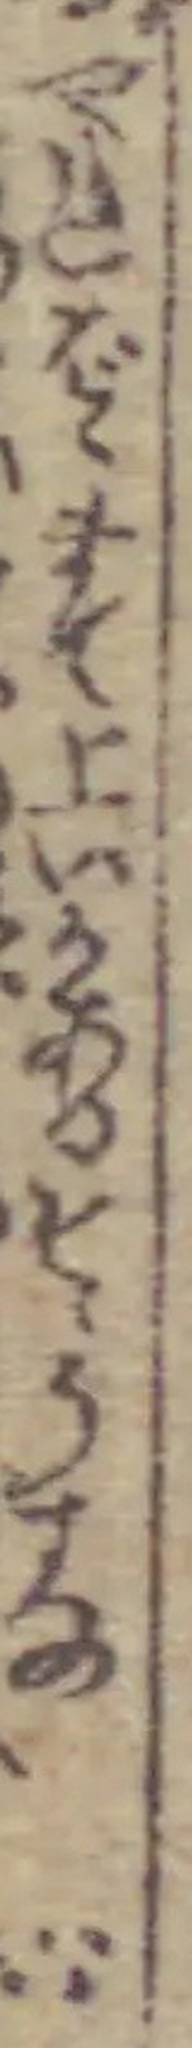やればゝまて上いがあるそゝうすな
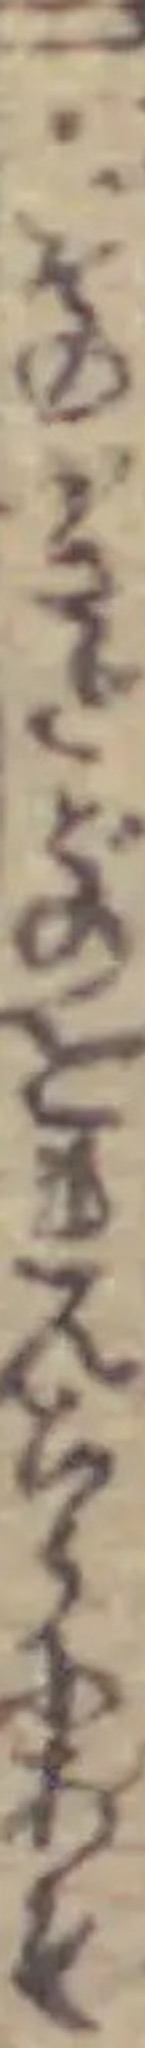そのおさだどのをれんちうにあそ
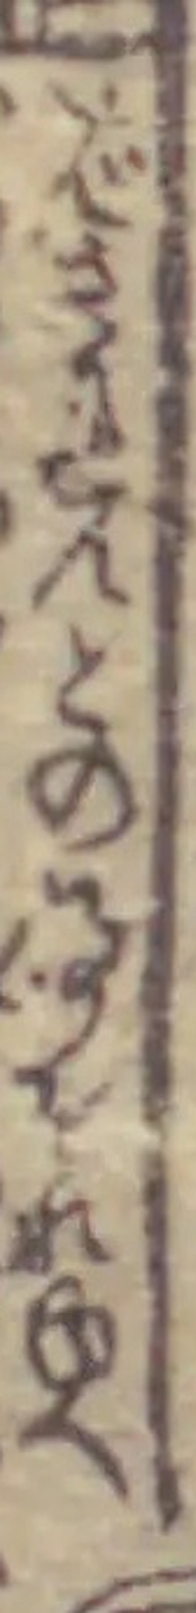ばされんとの事それゆへ
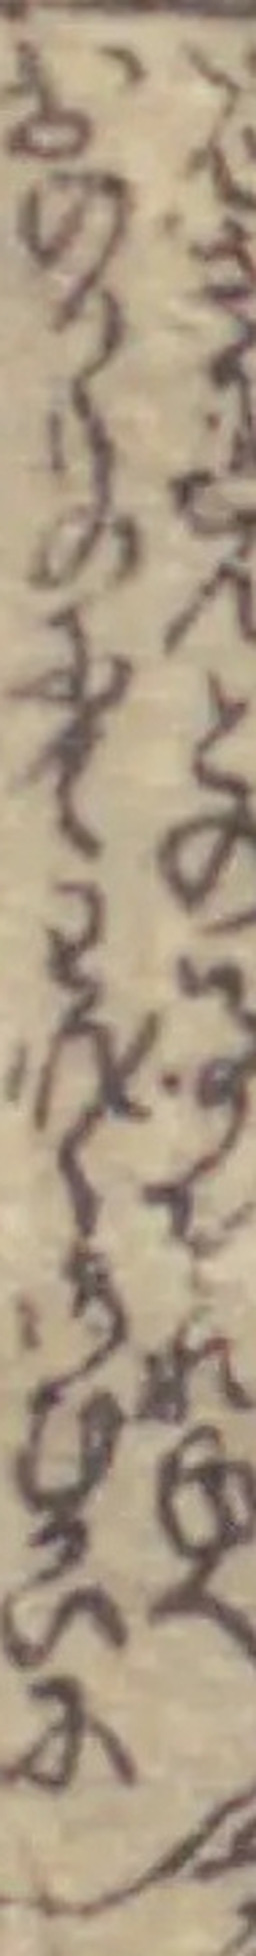おのりものにてわん〳〵御むかいに
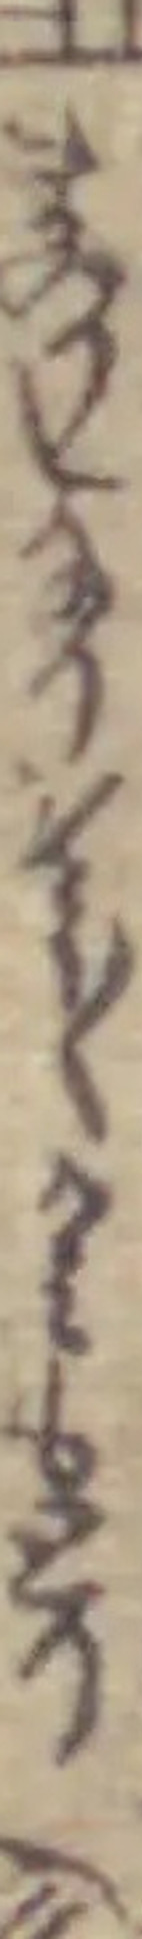まいりしなりそう〳〵かみもとり
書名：奥州咄 3巻
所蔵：国立国会図書館 National Diet Library, JAPAN
